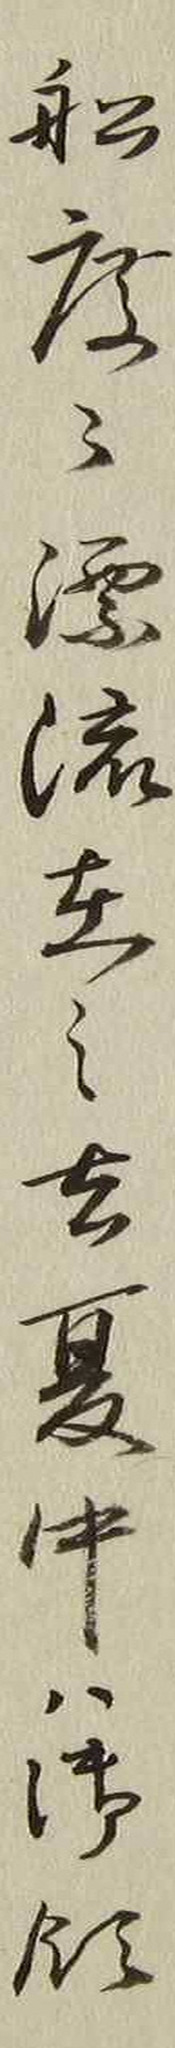船度々漂流在之去夏中ハ御領
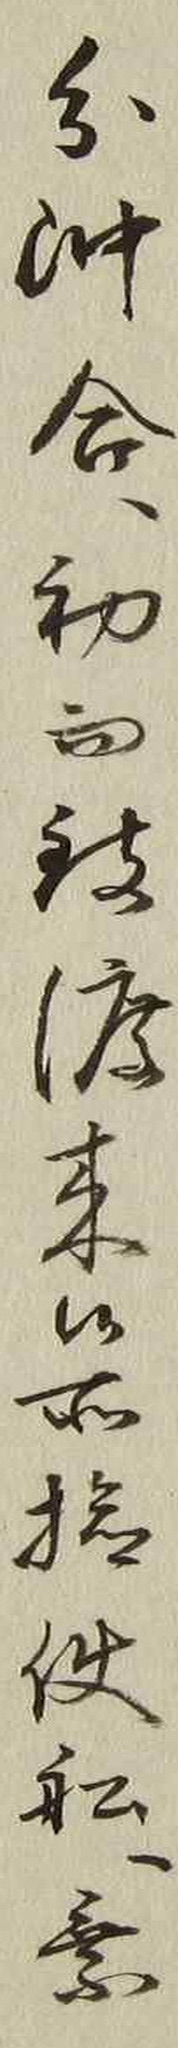分沖合へ初而致度来候所検使船へ乗
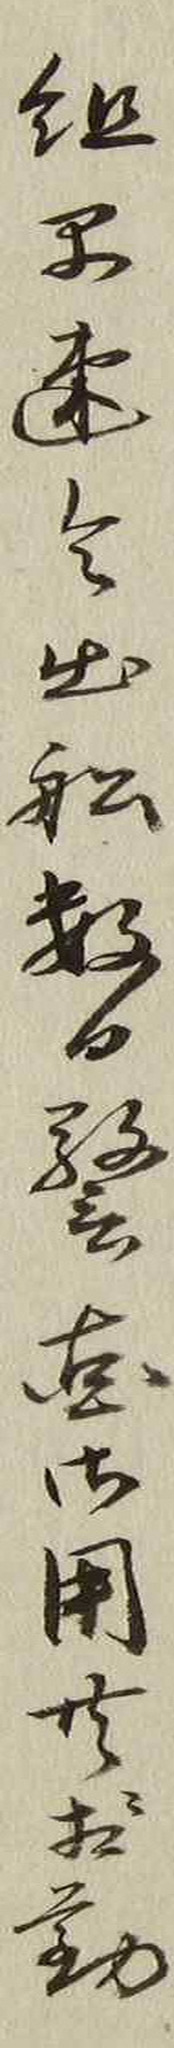組早速令出船数日警固御用共ニ相勤
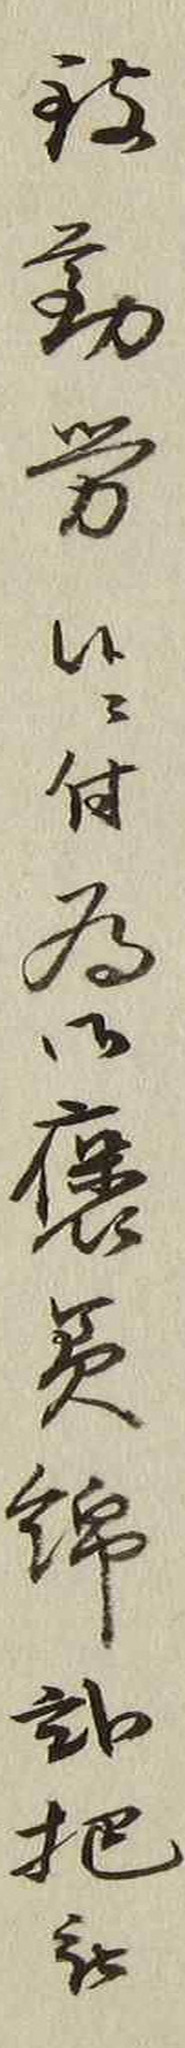致勤労候ニ付為御褒美錦弐把被
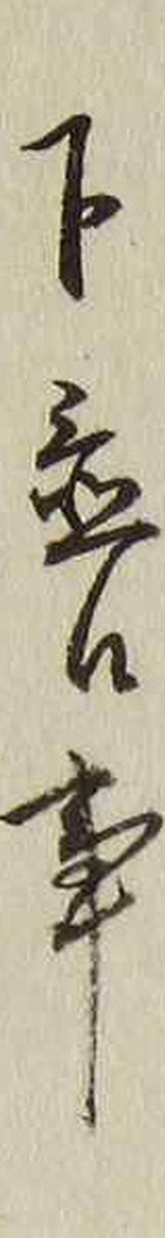下置候事
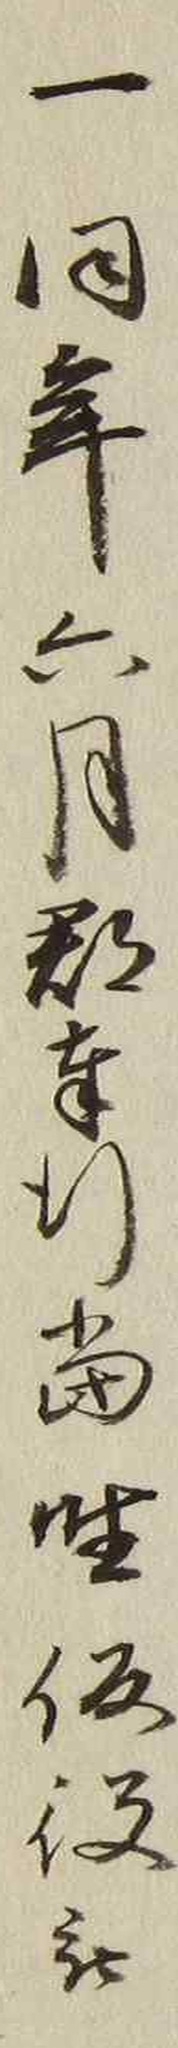一同年六月郡奉行当坐仮役被
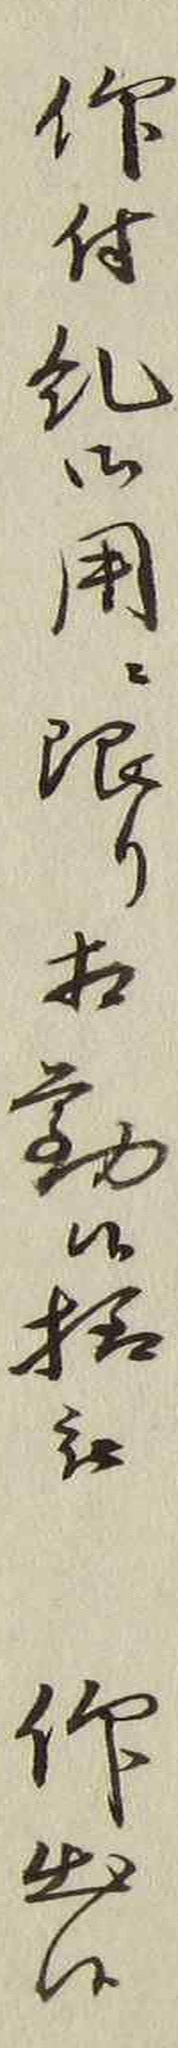仰付糺御用ニ限り相勤候様被仰出候

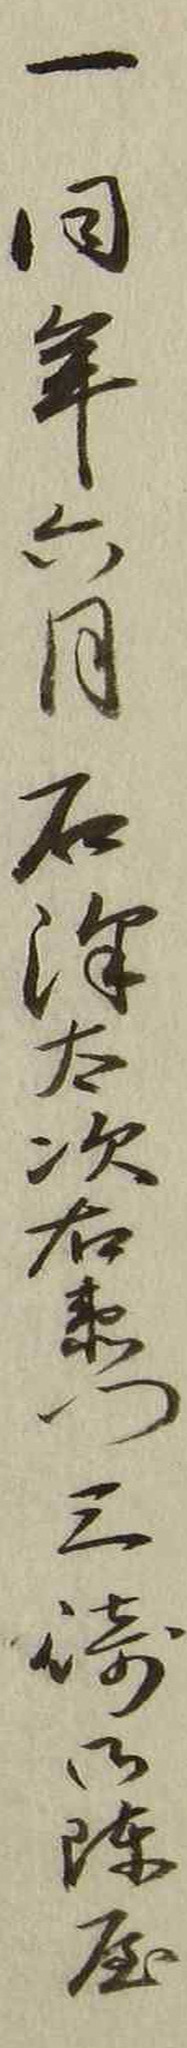一同年六月石澤太次右衛門三崎御陣屋
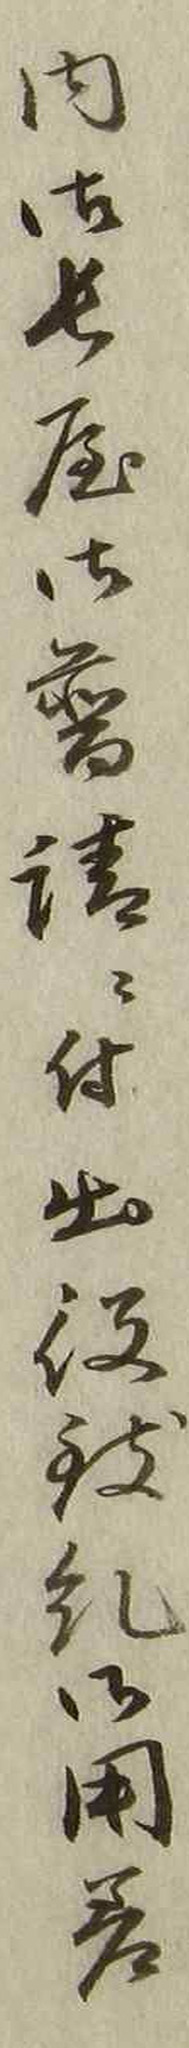内御長屋御普請ニ付出役致糺御用差
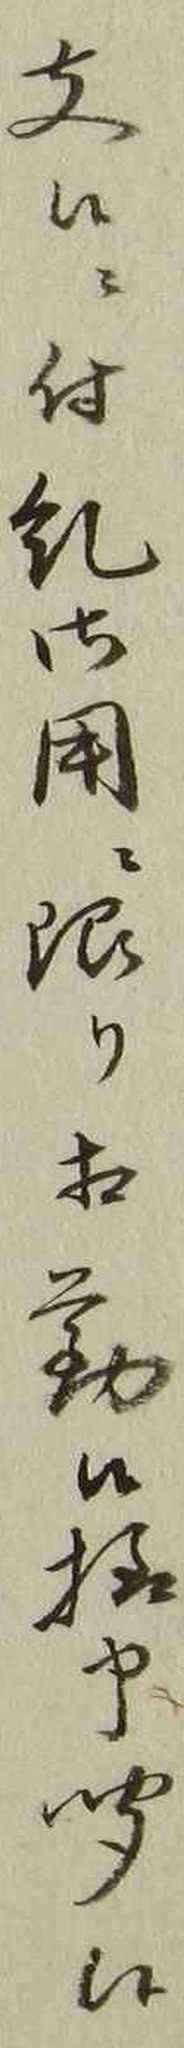支候ニ付糺御用ニ限り相勤候様申聞候
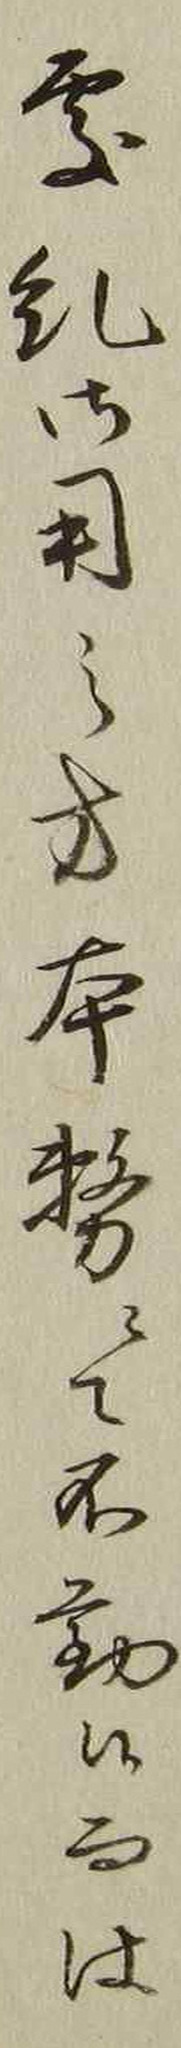処糺御用之方本務ニて不勤候而は
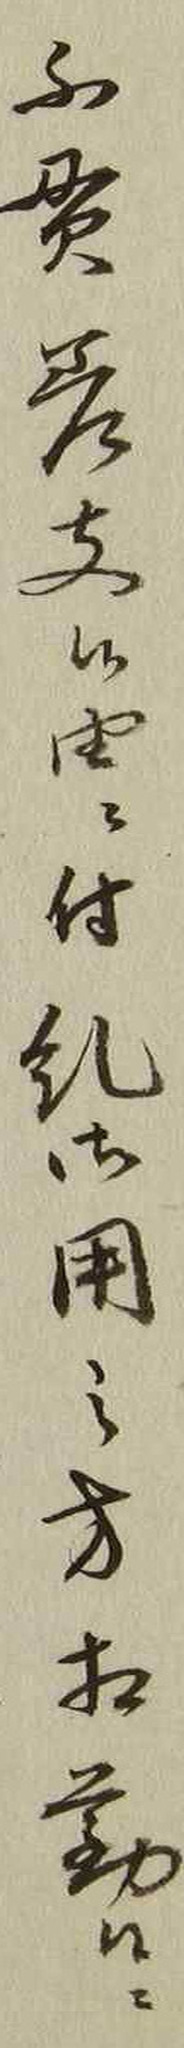不貫差支候由ニ付糺御用之方相勤候ニ
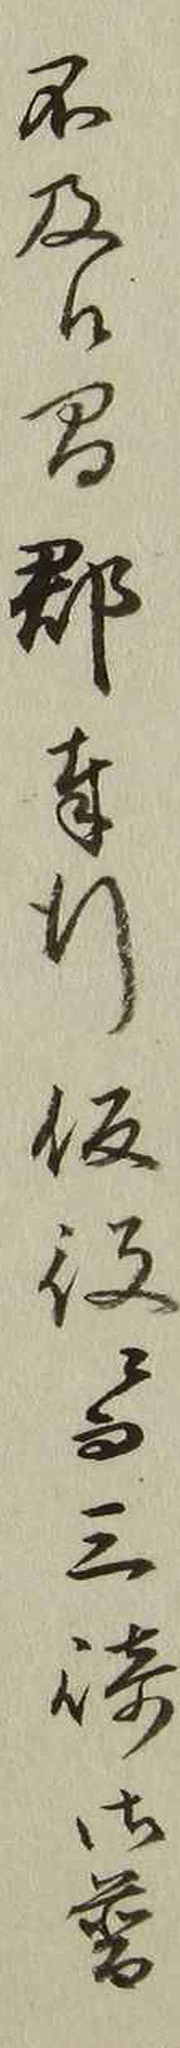不及候間郡奉行仮役ニ而三崎御普
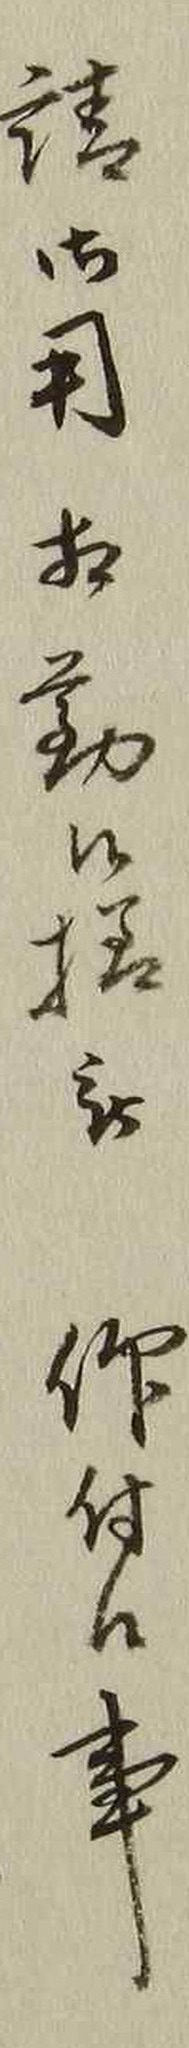請御用相勤候様被仰付候事
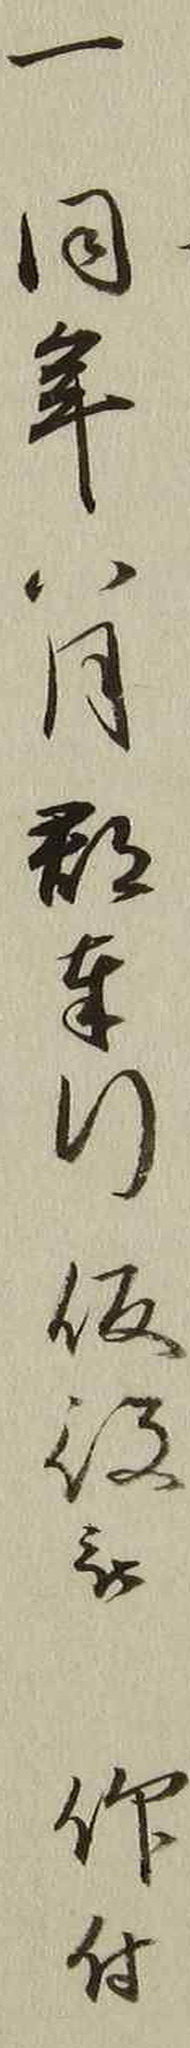一同年八月郡奉行仮役被仰付
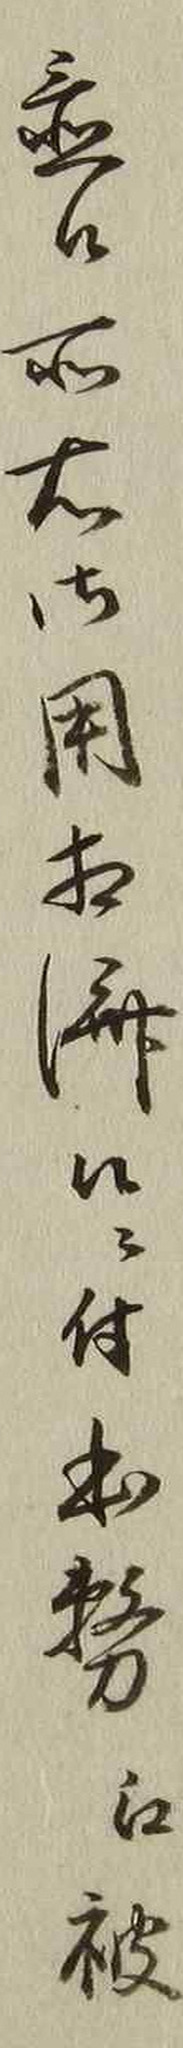置候所右御用相済候ニ付本務江被
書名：諸士系譜　巻之128　た之部4
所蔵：会津若松市立会津図書館
